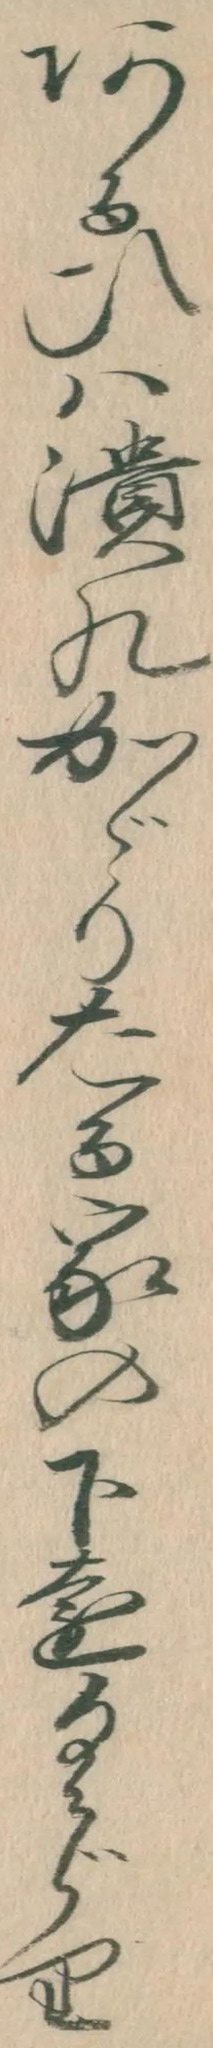あるひは潰れかゞりたる家の下をくゞり
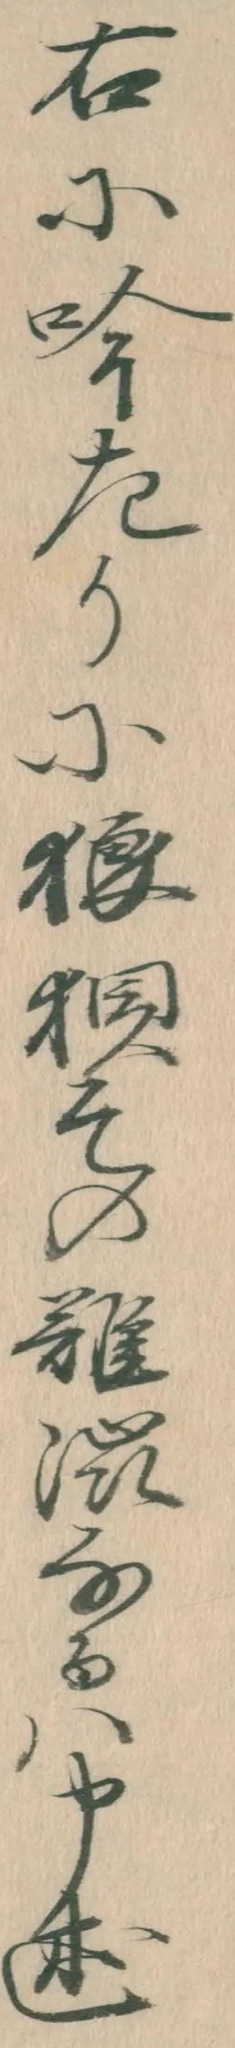右に吟左りに狼狽その難渋なるは申述
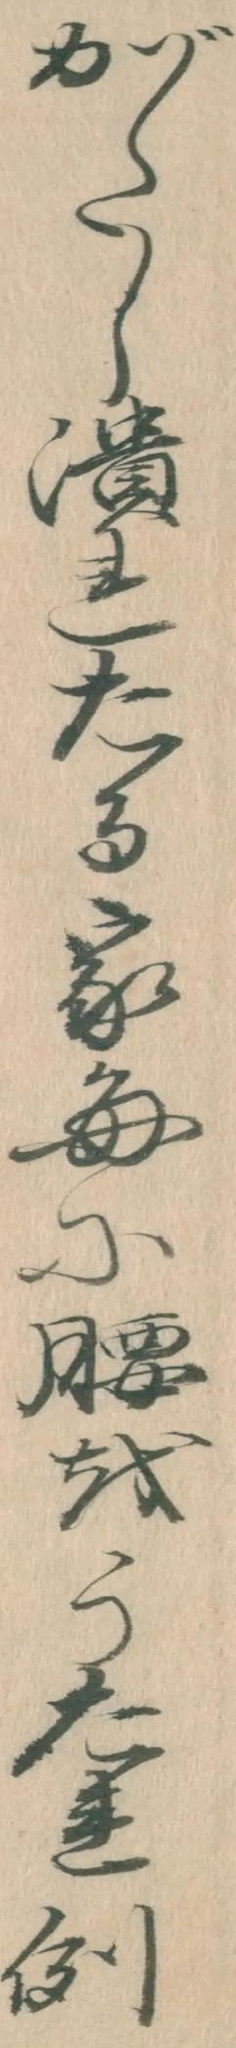がたく潰れたる家毎に腰をうたれ倒
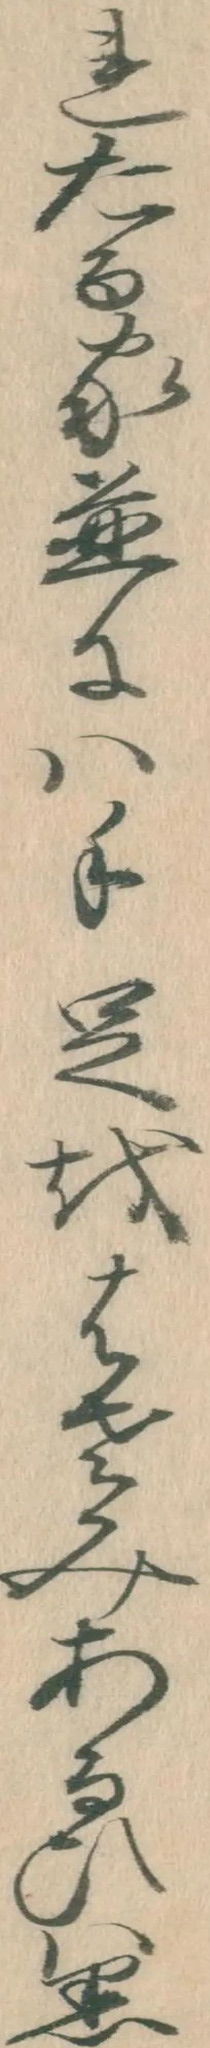れたる家並には手足をはさみあるひは黒
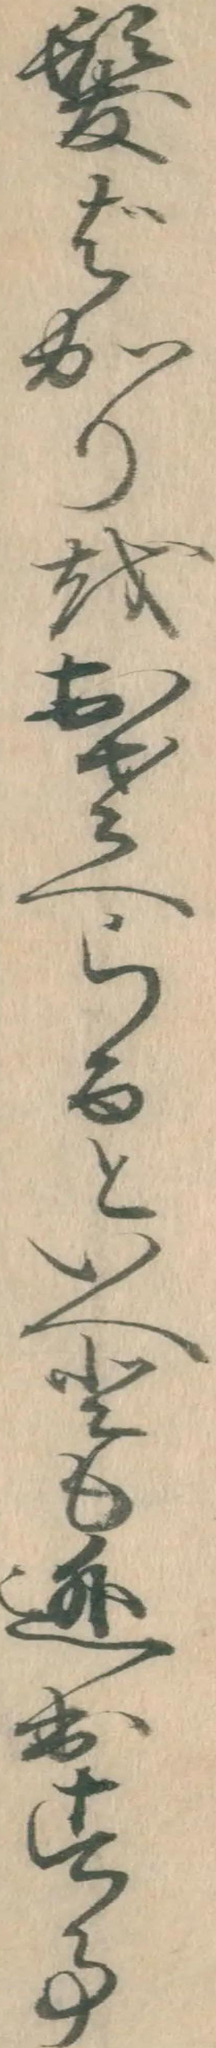髪ばかりをおさへらるといへとも逃出す事

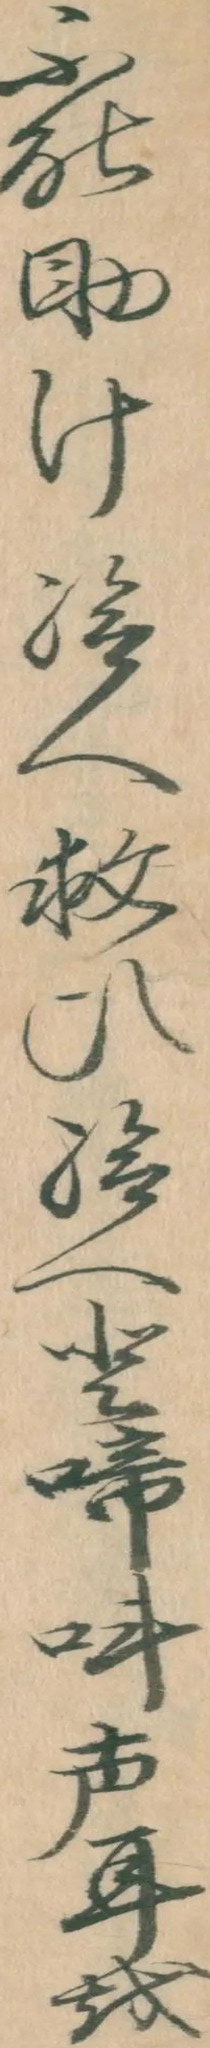不能助け給へ救ひ給へと啼叫声耳を
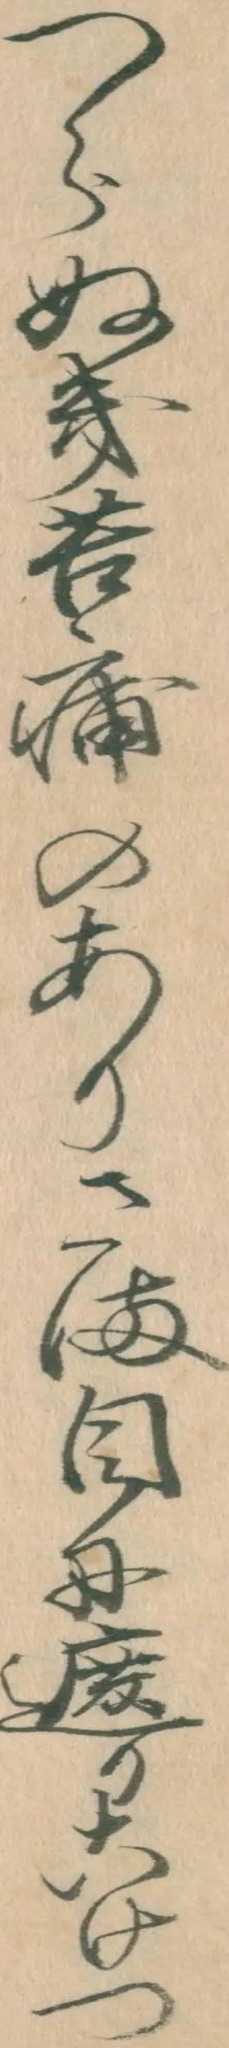つらぬき苦痛のありさま目に遮りこけつ
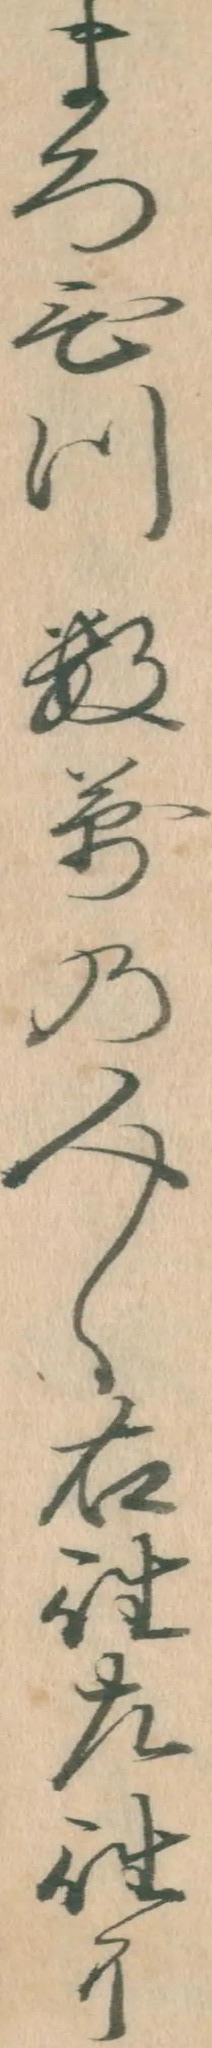まろひつ数万の人〳〵右往左往に
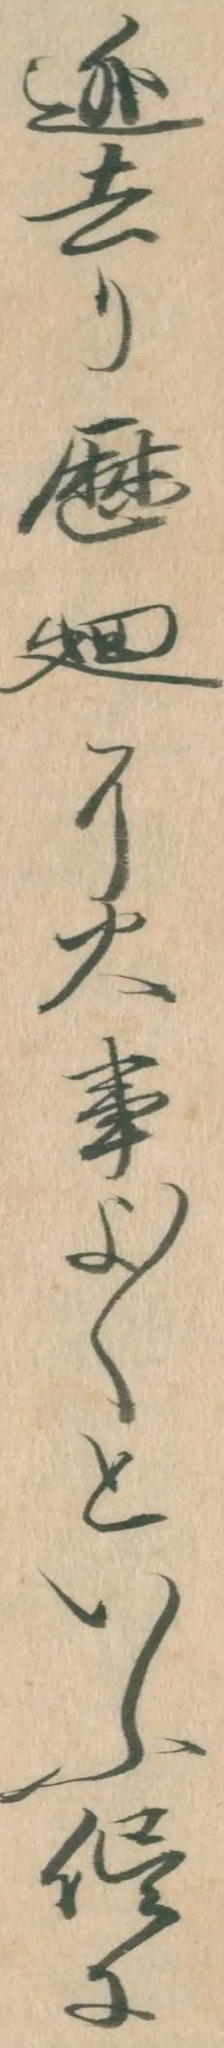逃去り歴廻に火事よ〳〵といふ侭に
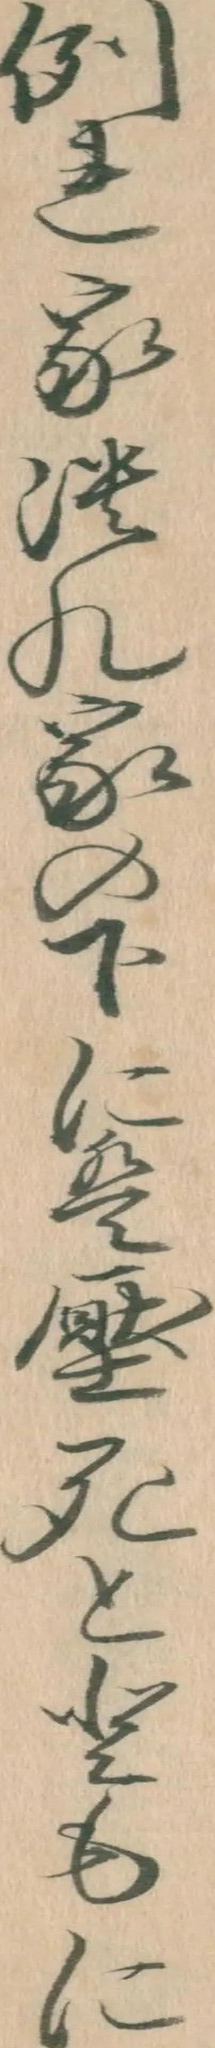倒れ家潰れ家の下には圧死とともに
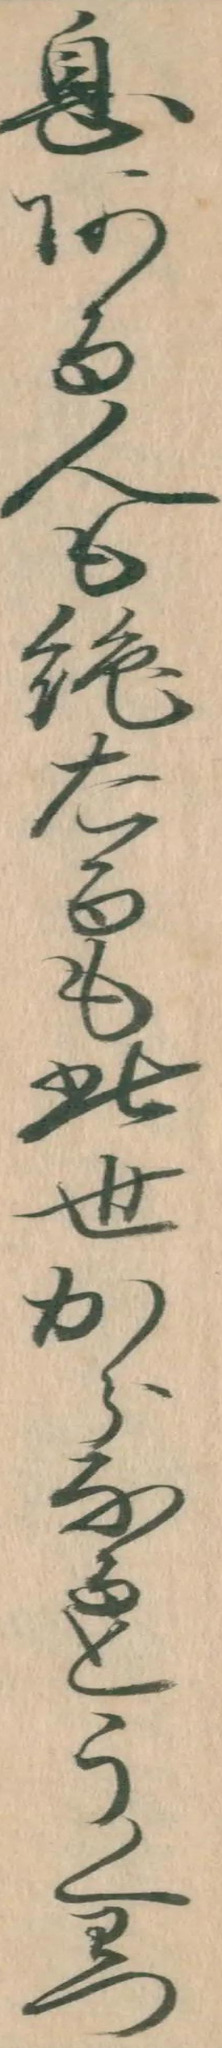息ある人も絶たるも此世からなるとうくゎつ
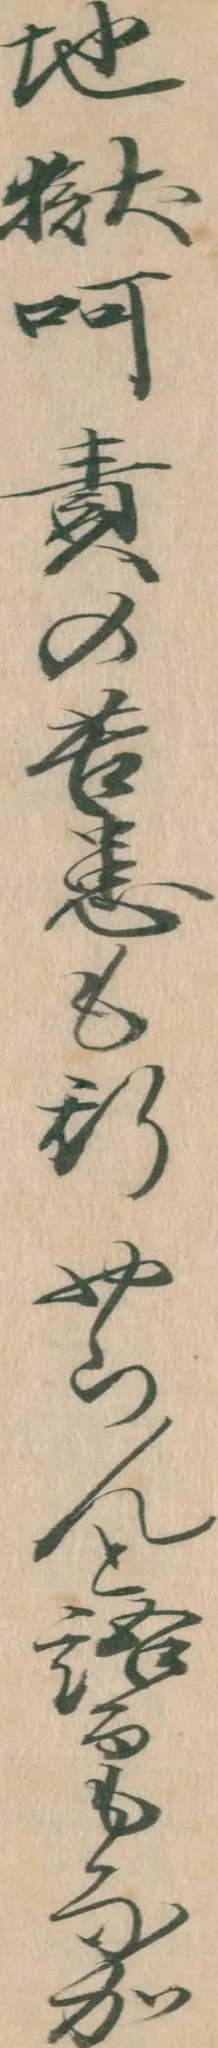地獄呵責の苦患も斯やらんと語るもなが
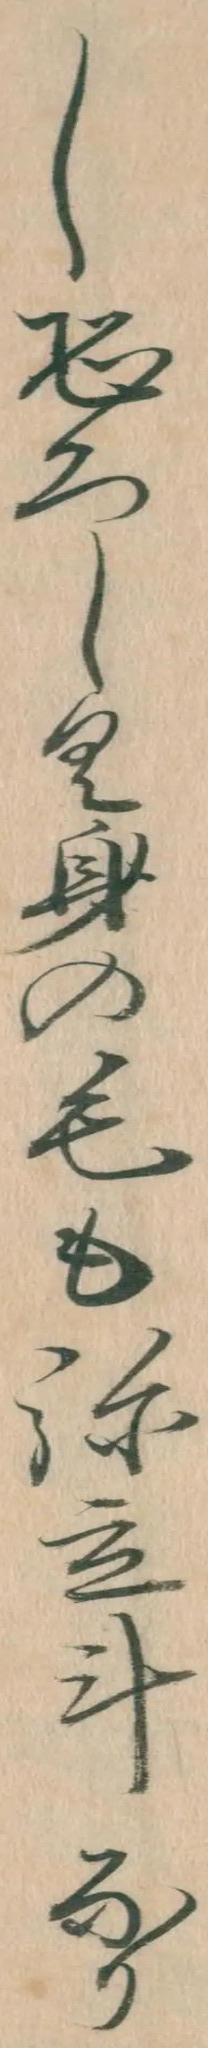〳〵恐ろしく身の毛も弥立斗なり
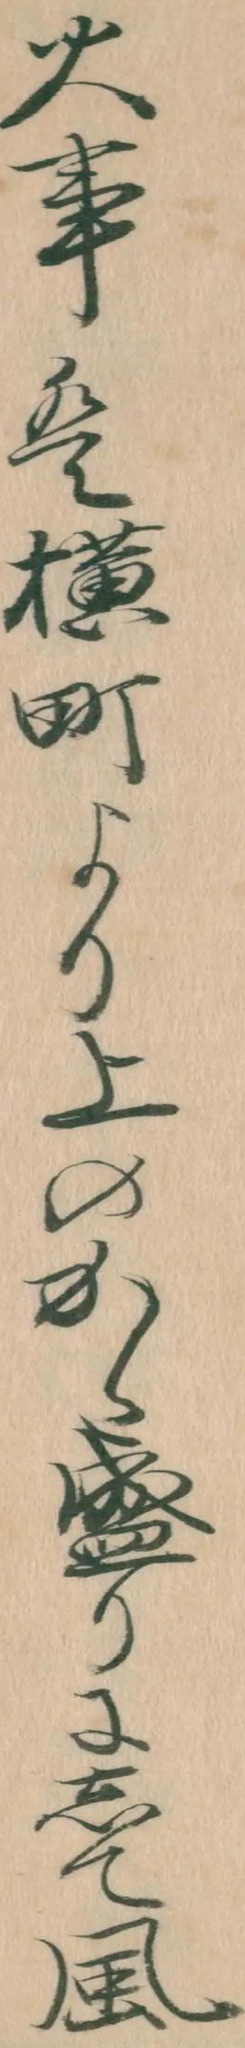火事は横町より上のかた盛りにして風
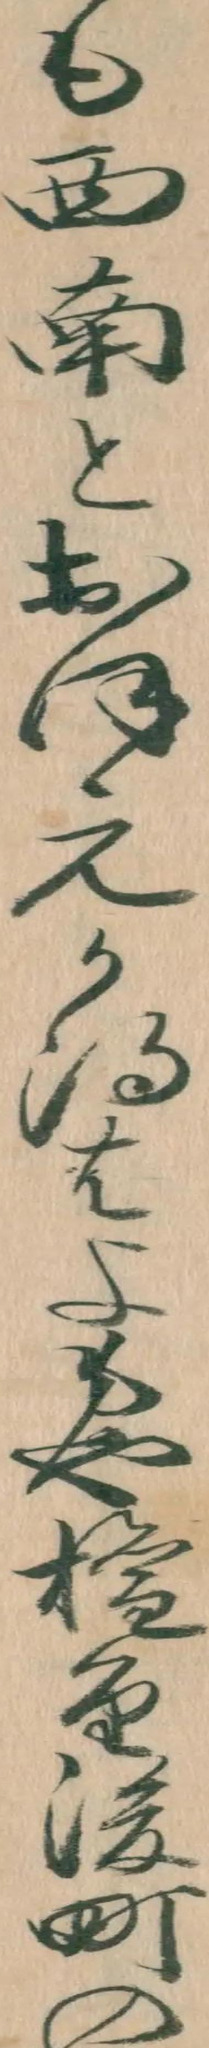も西南とおほえ候得はよもや権堂後町の
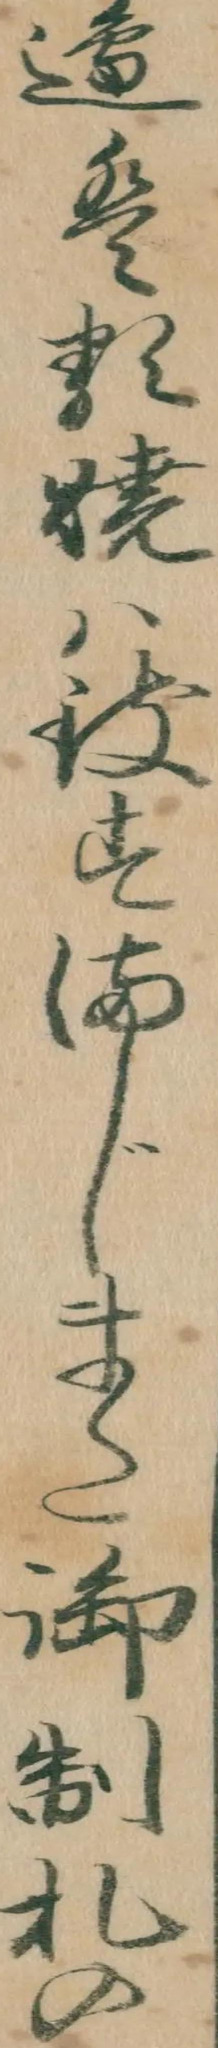辺は類焼は致すまじまた御制札の
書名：俗語之種. [3]
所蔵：国立国会図書館 National Diet Library, JAPAN
